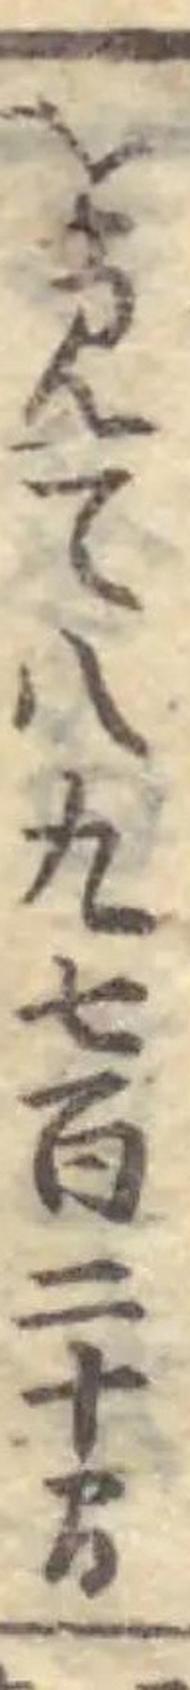を見て八九七百二十間
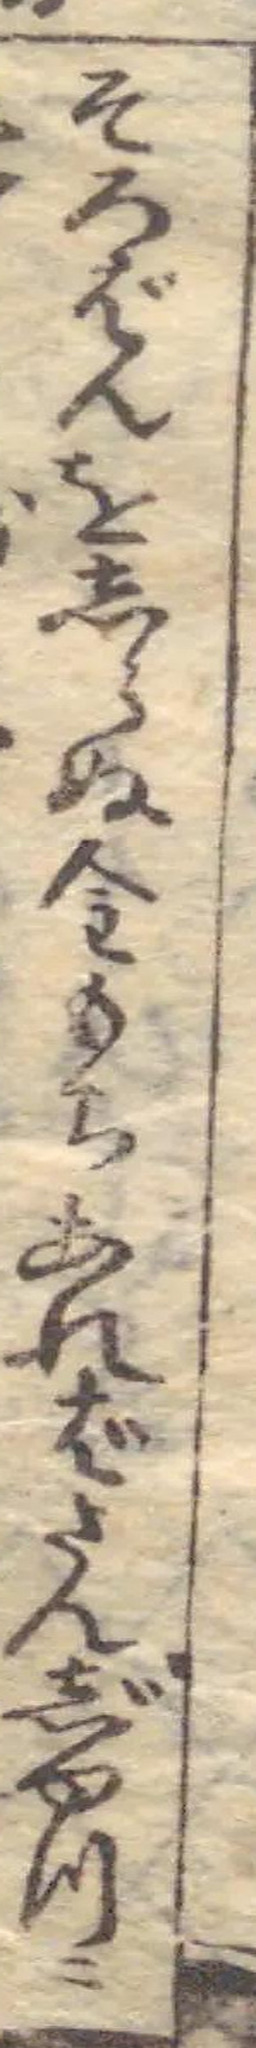そろばんをしらぬ金もちあればさんじゆつに
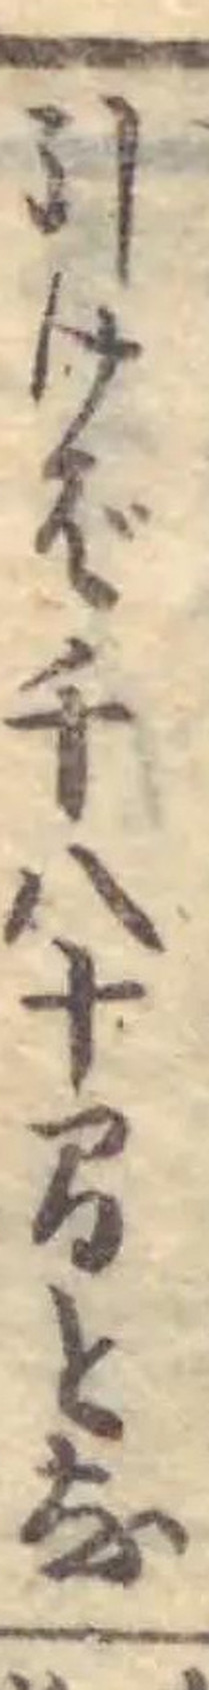引けば千八十間とな
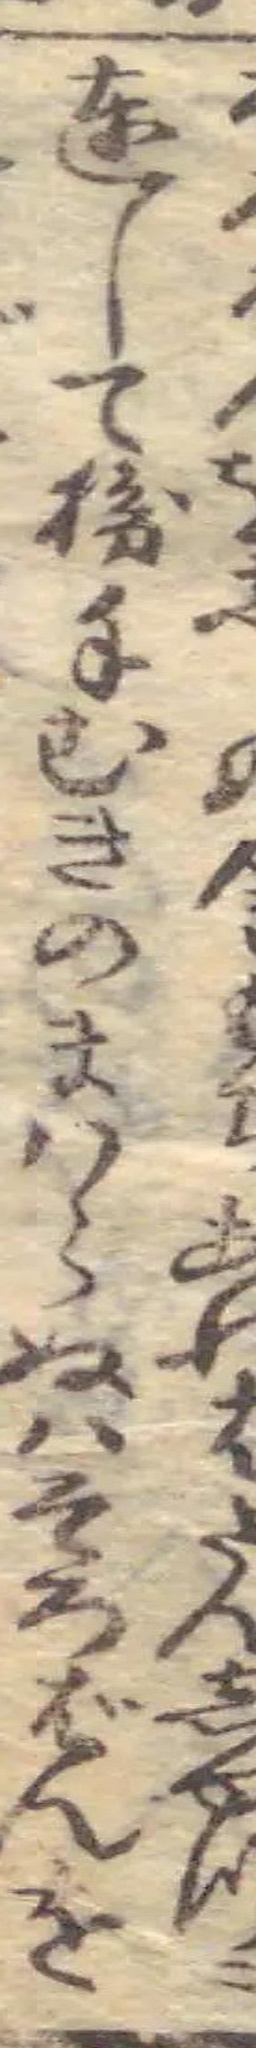達して勝手むきのまはらぬはそろばんを
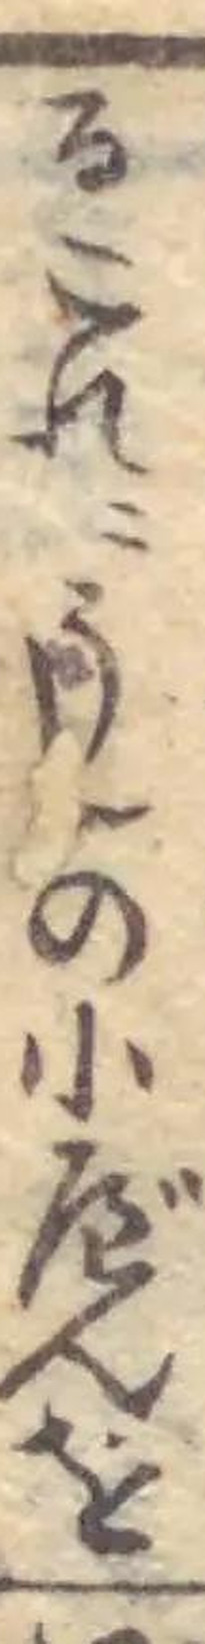るこれにうしの小べんを
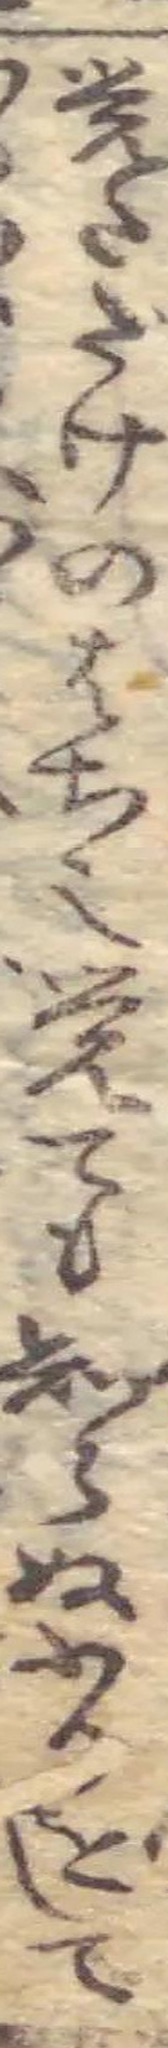覚ただけのばち也覚ても知らぬふりをして
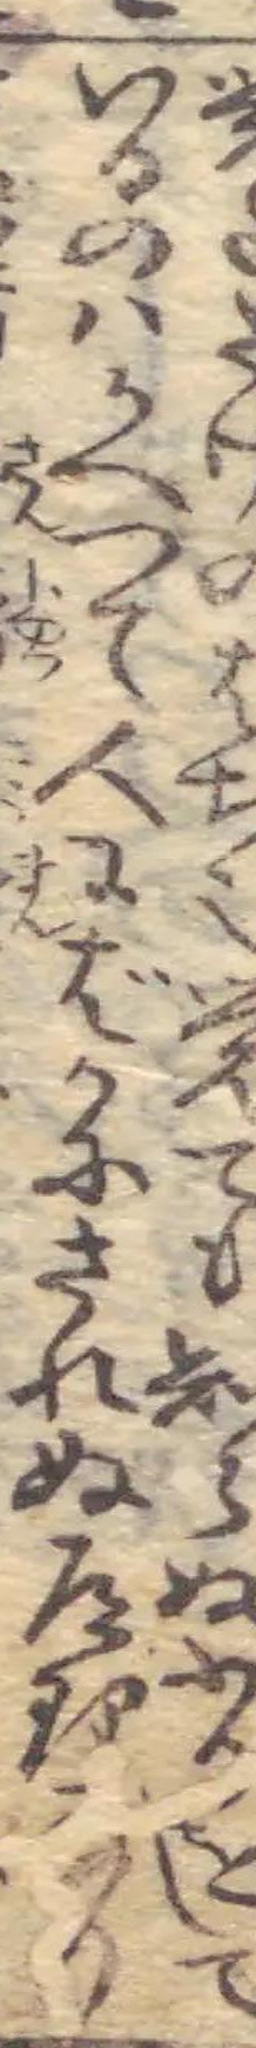いるのはかへつて人にばかにされぬ道理なり
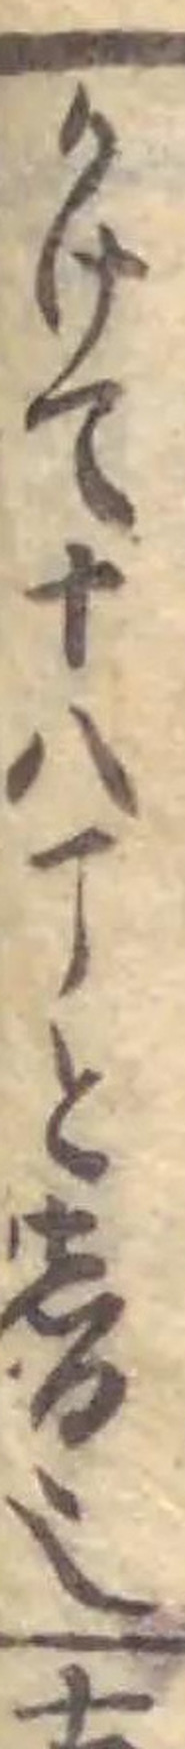かけて十八丁としる也
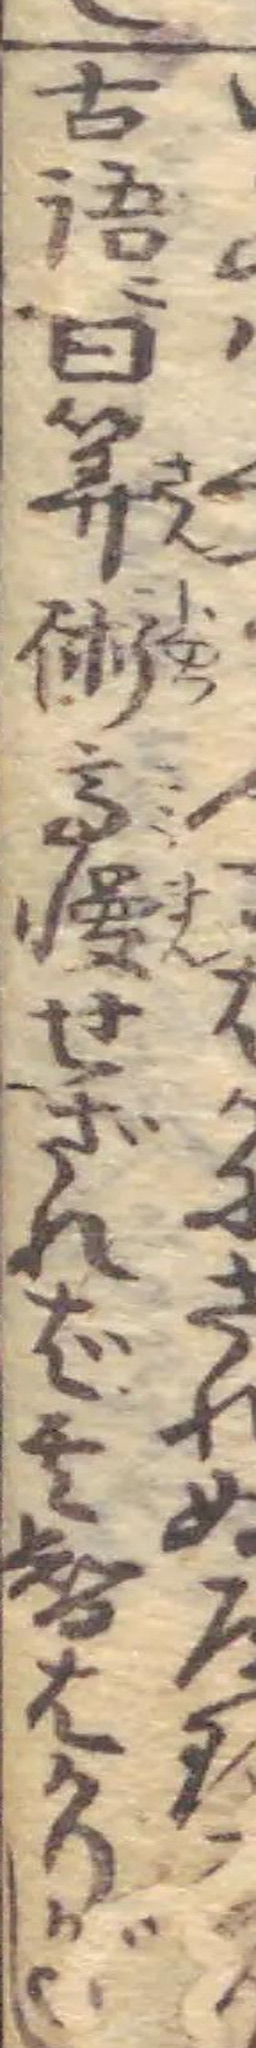古語に曰算術高慢せざれば其智はかりがたし
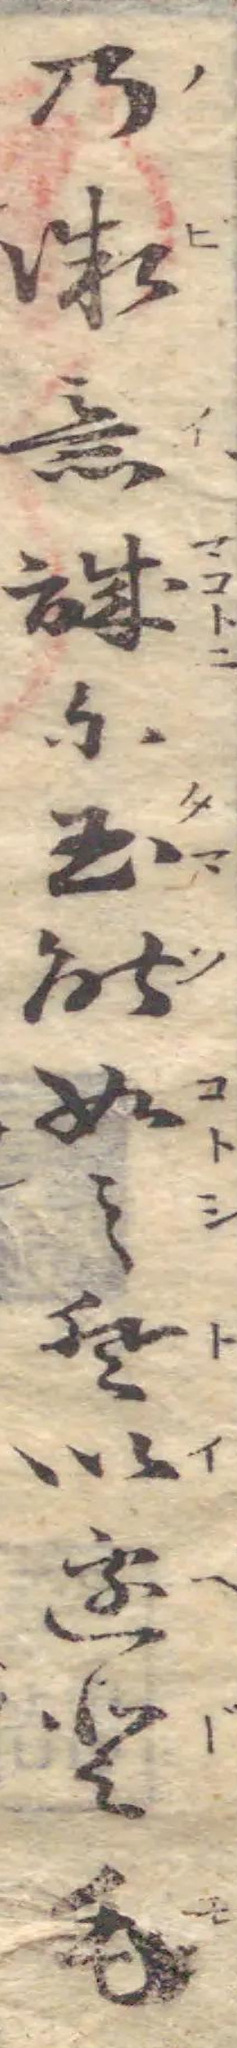乃御意誠尓玉能如之登以辺登毛
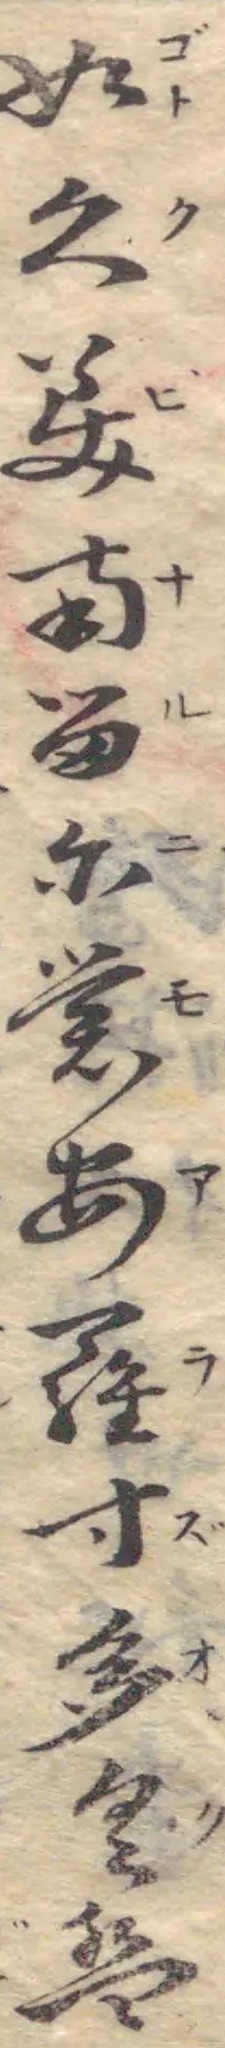如久美南留尓裳安羅寸多具盤
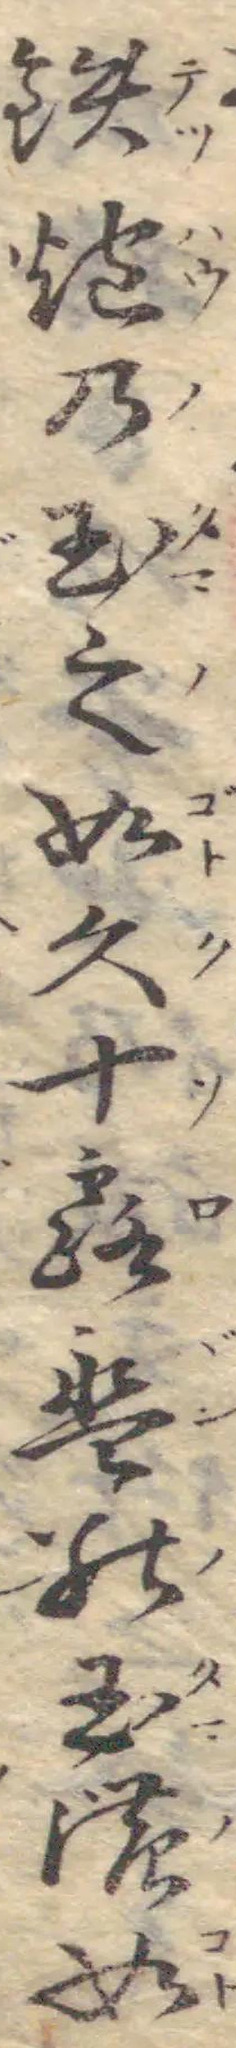鉄炮乃玉之如久十露盤能玉濃如
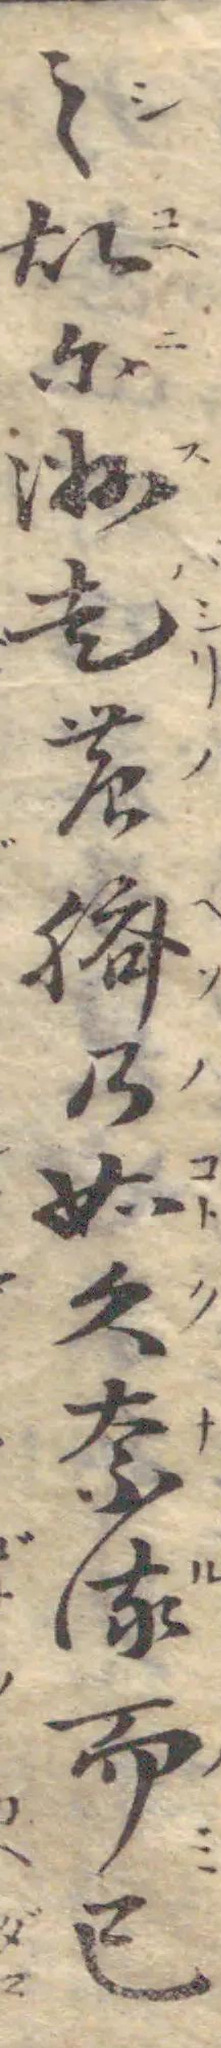之故尓洲老農臍乃如久奈流而己
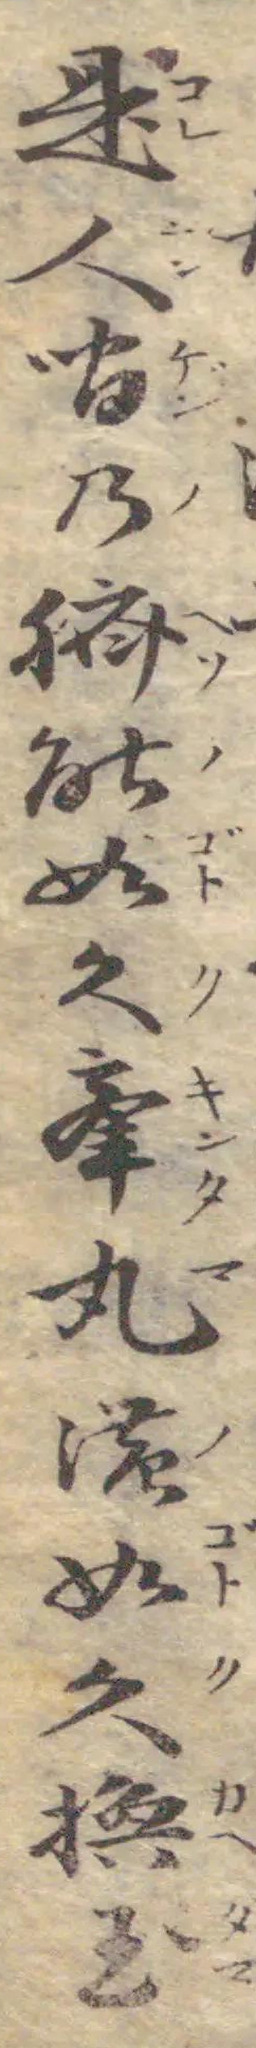是人間乃臍能如久牽丸濃如久換玉

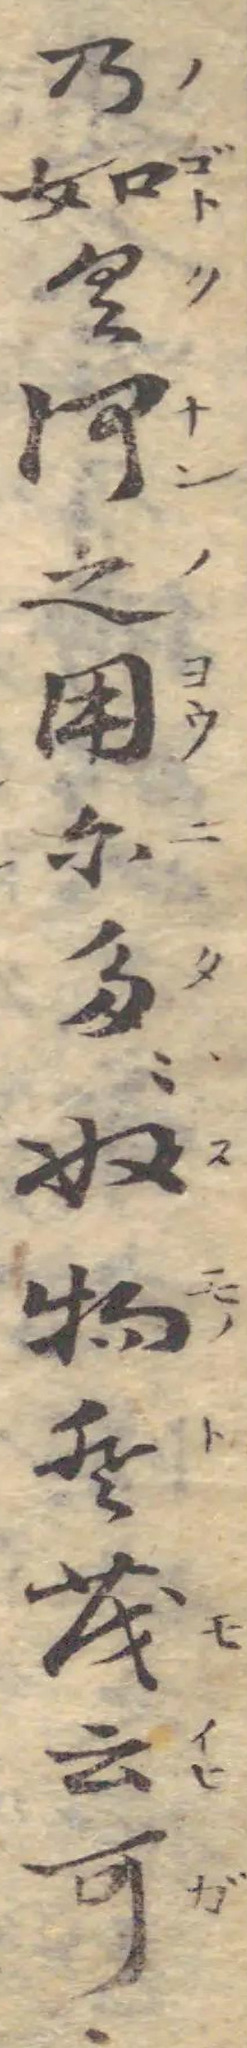乃如具何之用尓多々奴物登茂云可
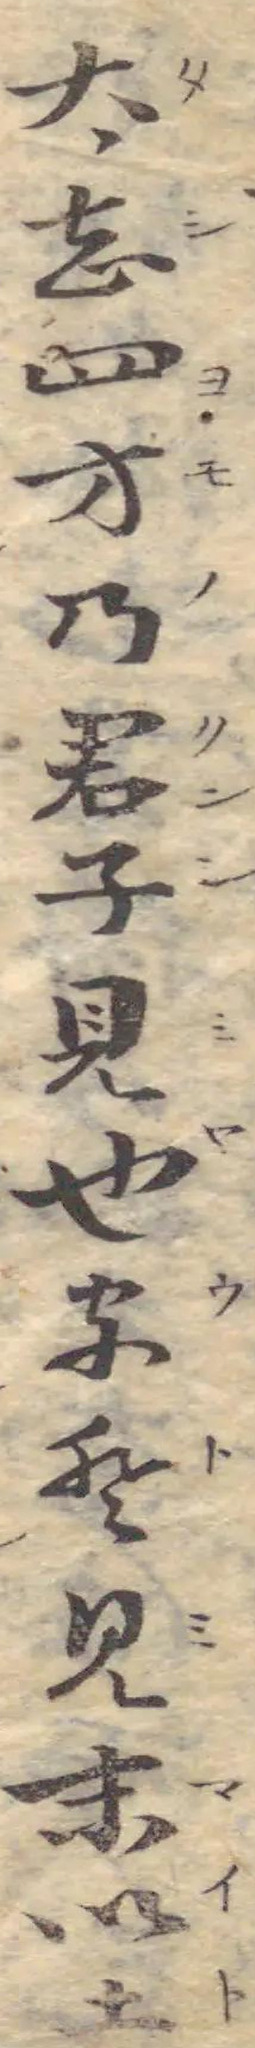太志四方乃君子見也宇登見末以土
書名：大通人好記
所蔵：国立国会図書館 National Diet Library, JAPAN
